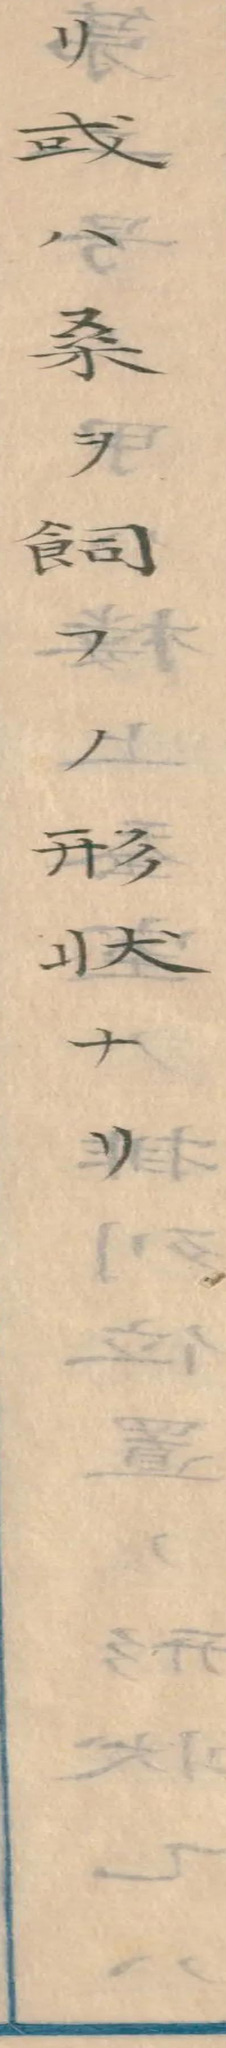リ或ハ桑ヲ飼フノ形状ナリ
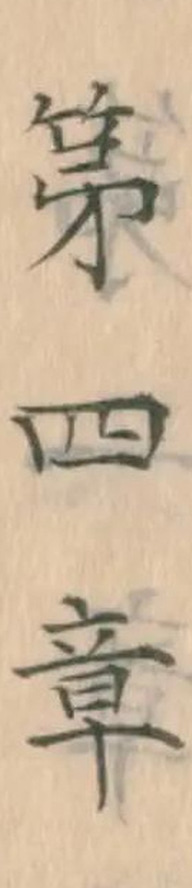第四章
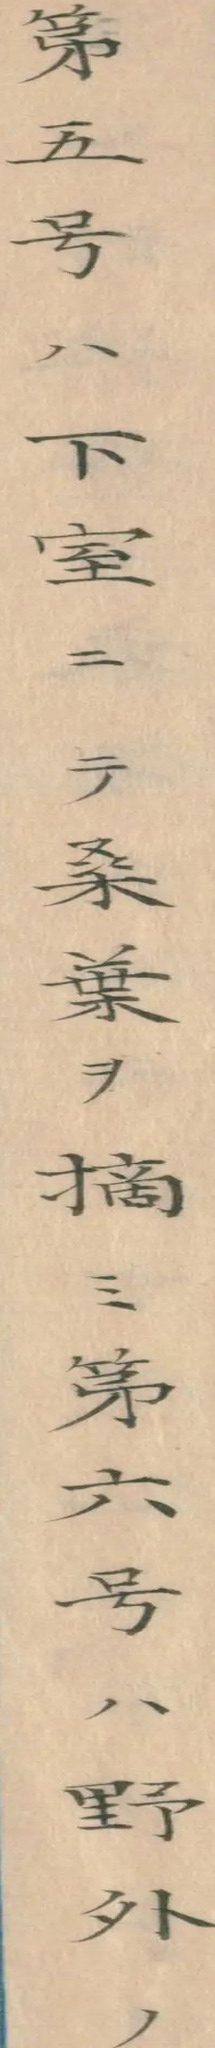第五号ハ下室ニテ桑葉ヲ摘ミ第六号ハ野外ノ
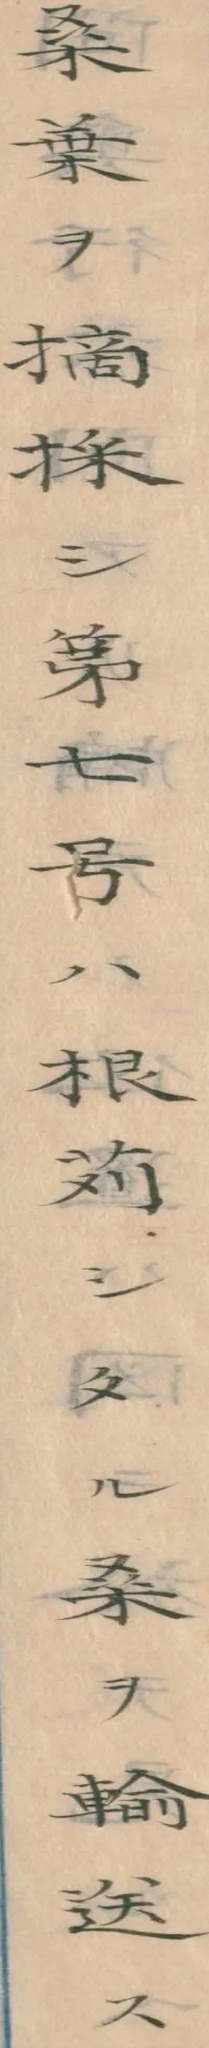桑葉ヲ摘採シ第七号ハ根苅シタル桑ヲ輸送ス
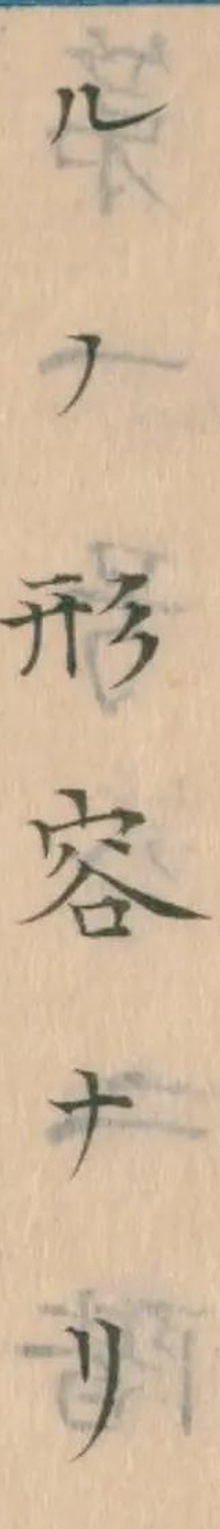ルノ形容ナリ
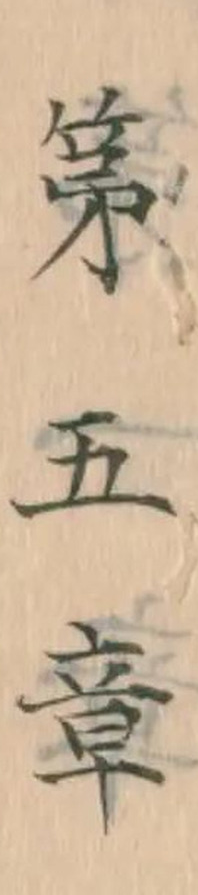第五章
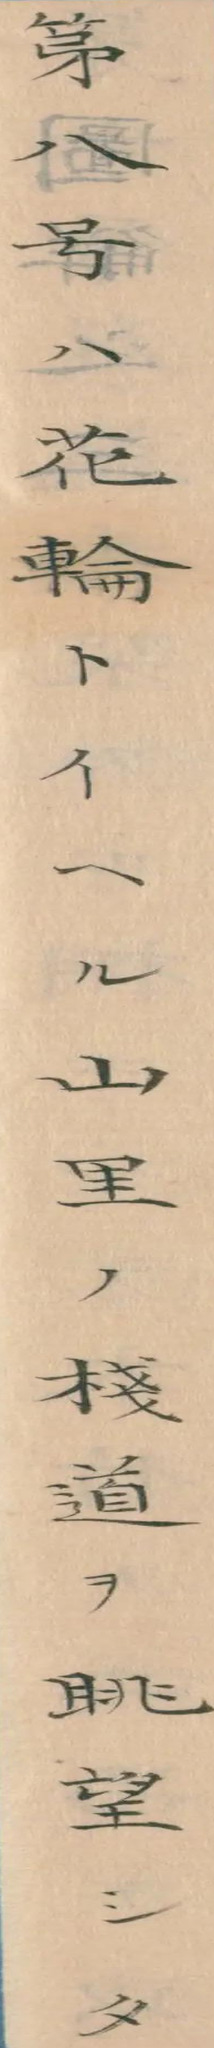第八号ハ花輪トイヘル山里ノ桟道ヲ眺望シタ
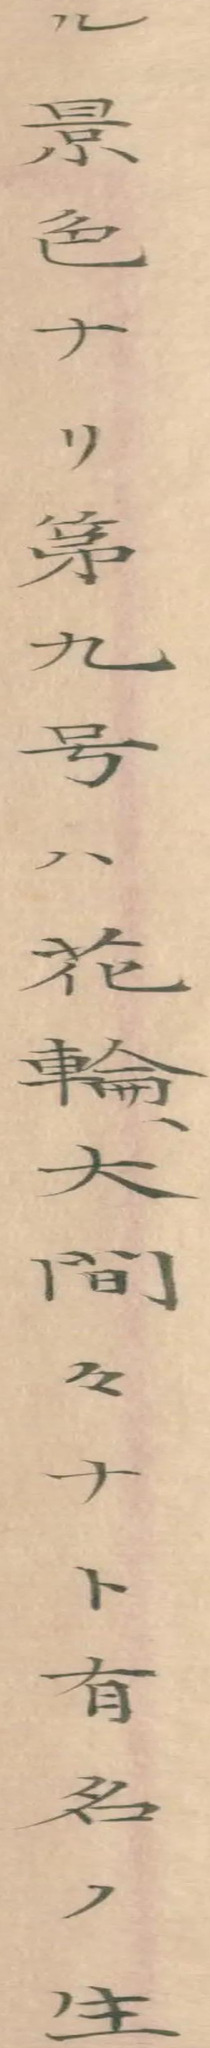ル景色ナリ第九号ハ花輪、大間々ナト有名ノ生
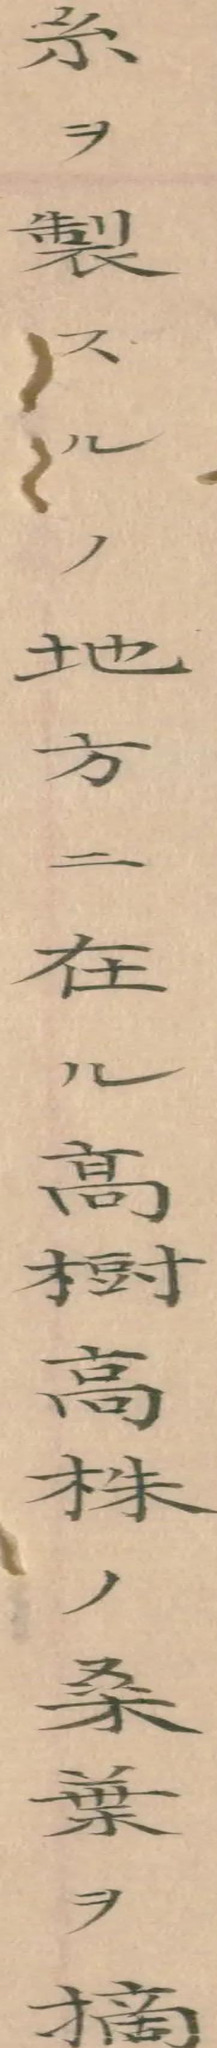糸ヲ製スルノ地方ニ在ル高樹高株ノ桑葉ヲ摘
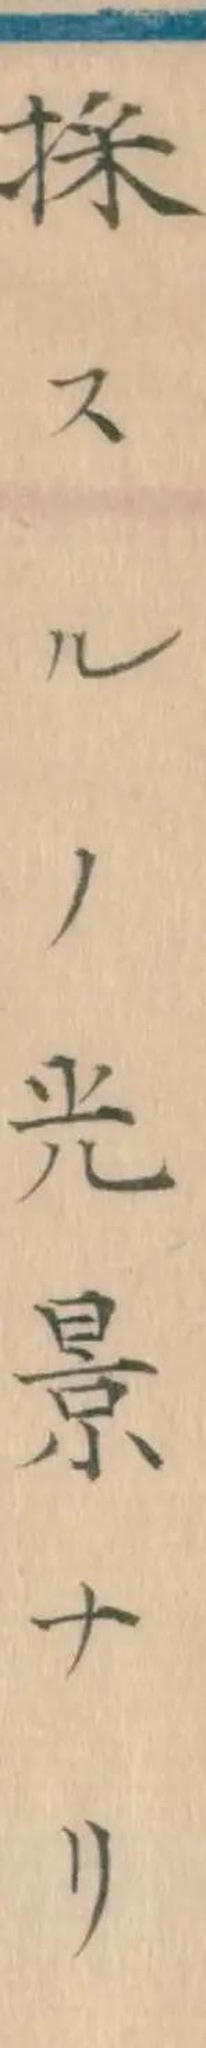採スルノ光景ナリ

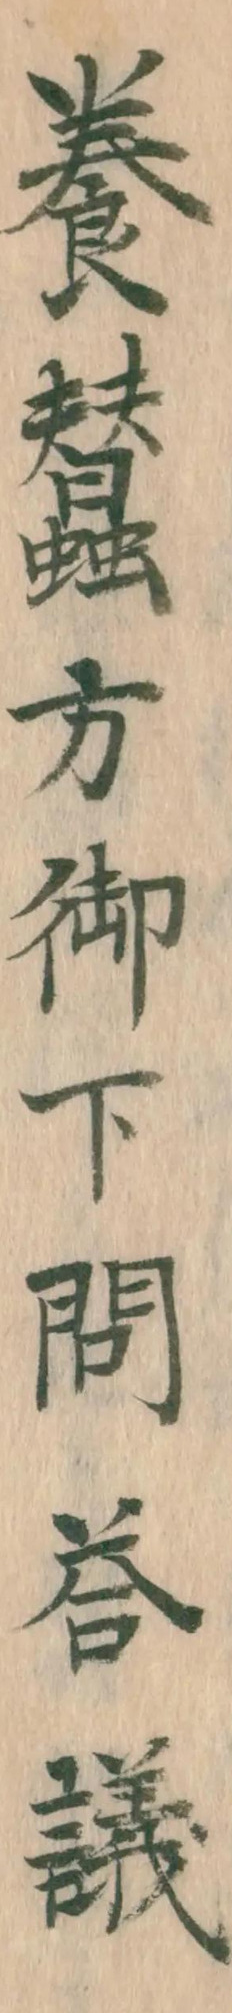養蚕方御下問答議

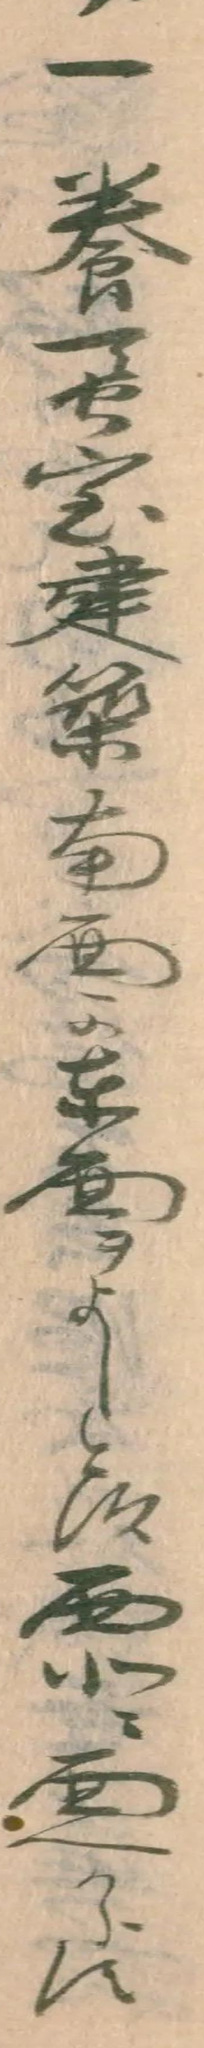第一養蚕室建築南西か東西ヲよしとす西北ニ面へからす
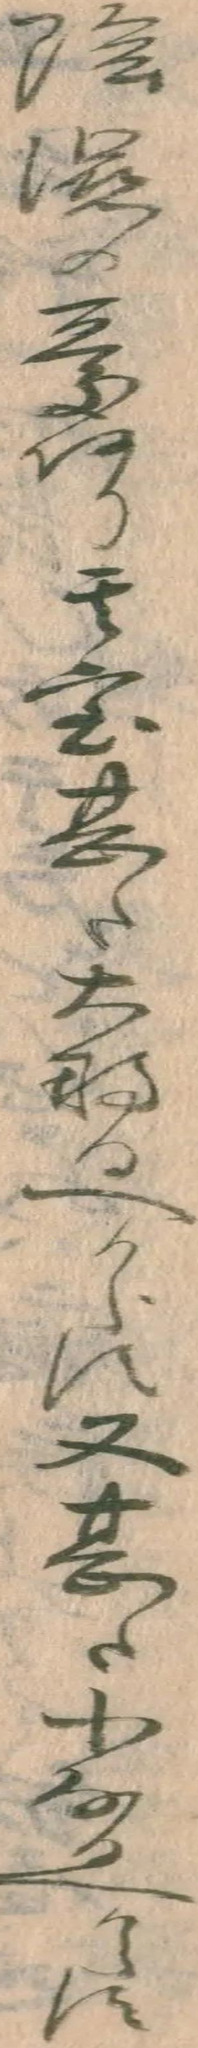陰湿の憂あり其室甚た大なるへからす又甚た小なるへからす
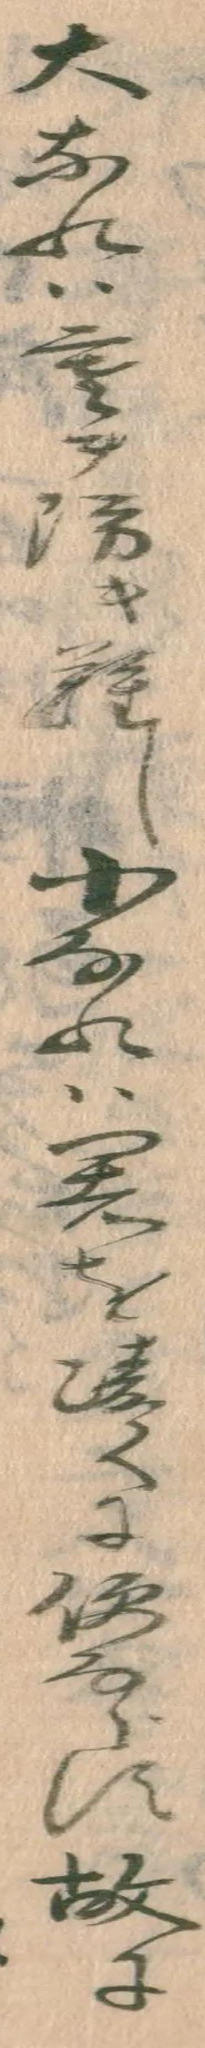大なれは寒ヲ防キ難し小なれは暑を凌くに便ならす故に
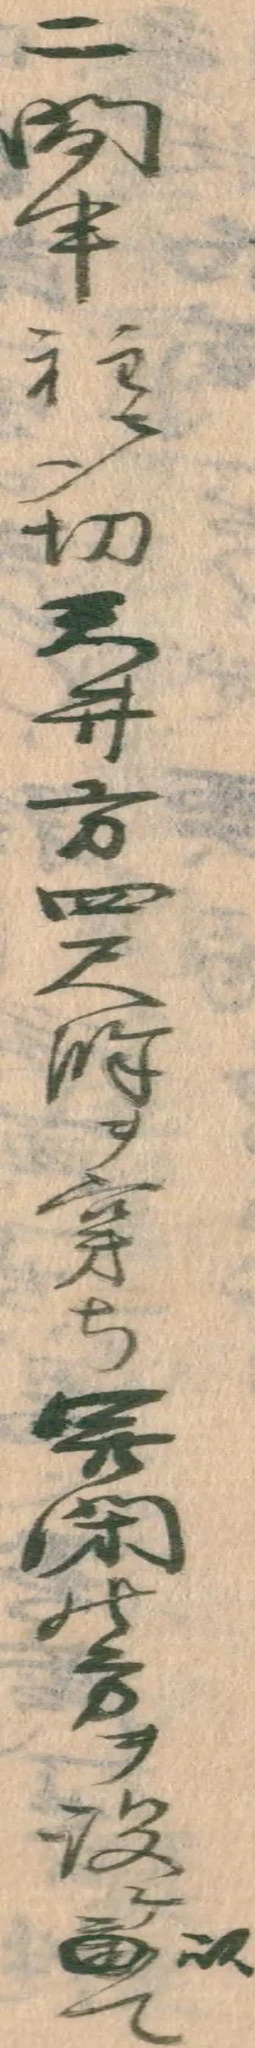二間半程ニ〆切天井方四尺余ヲ穿ち開閉の方ヲ設ケ以て
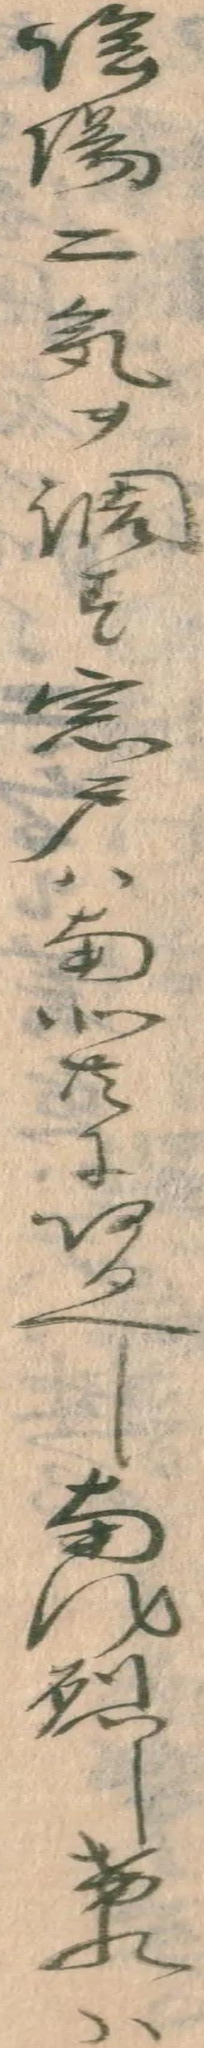陰陽ニ気ヲ調す窓戸ハ南北共にあるへし南風烈しけれは
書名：蚕桑集成
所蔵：国立国会図書館 National Diet Library, JAPAN
